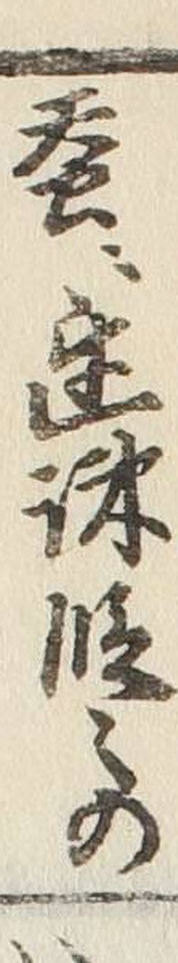蚕に遅速段々の
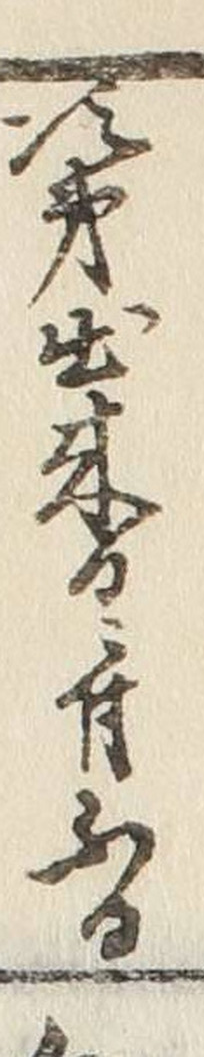次第出来るに付ふる
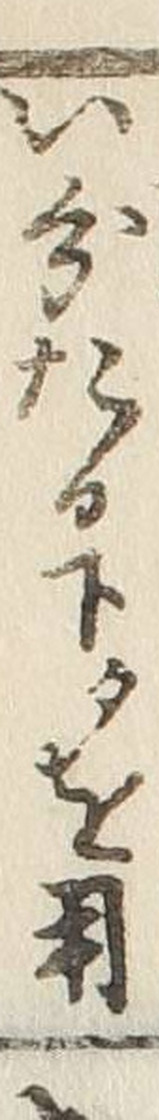い分たる下たを用
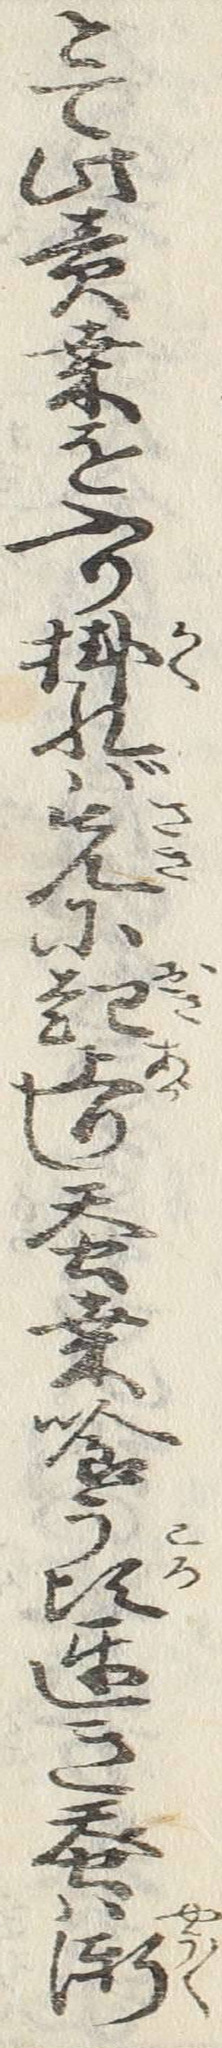とて此責桑をふり掛れば先に起上りし蚕桑喰う頃遅き蚕は漸
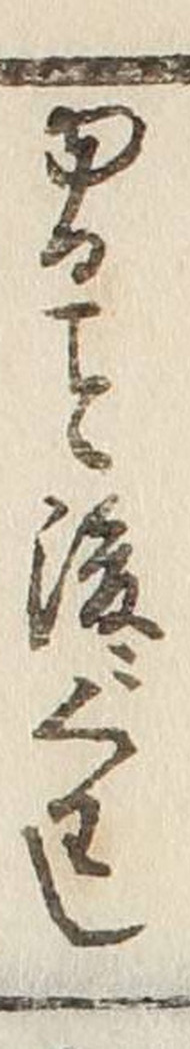ゆること後にくわし
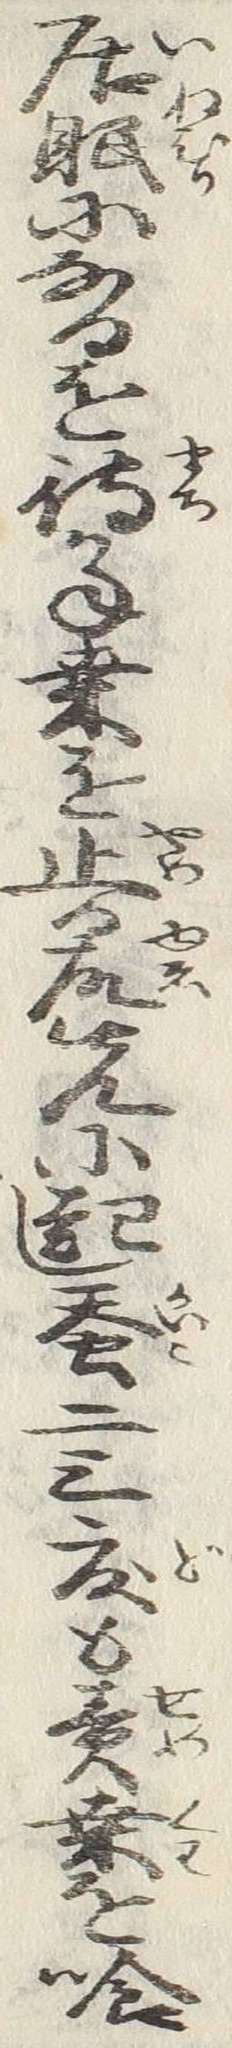居眠になるを待かね桑を止る故先に起し蚕二三度も責桑を喰
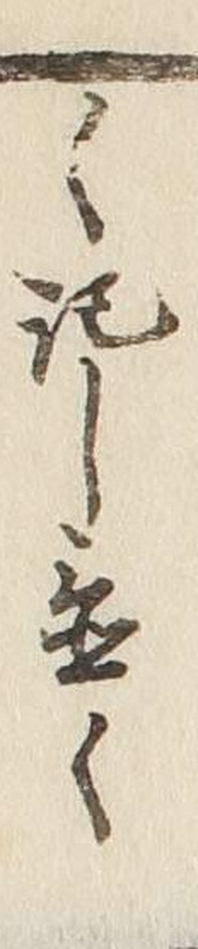く記し置く
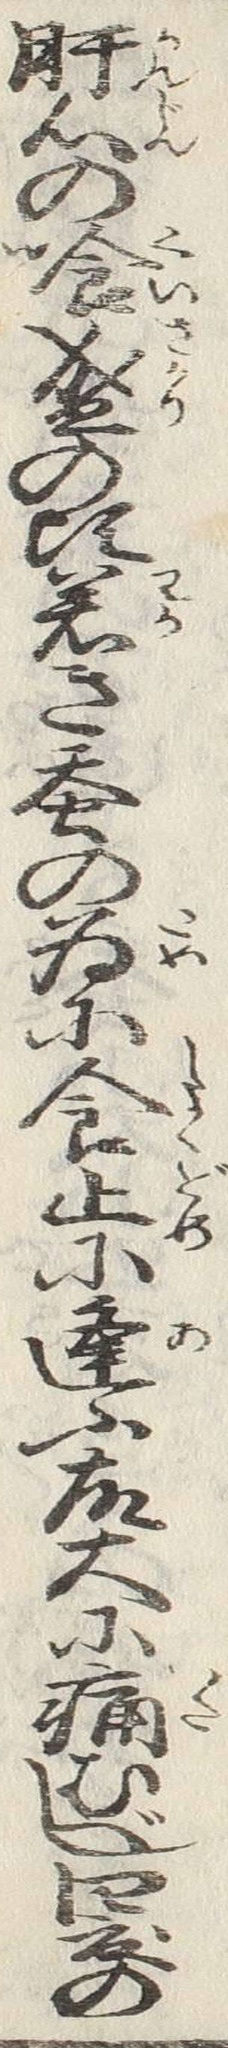肝心の喰盛の頃若き蚕の為に食止に逢ふ故大に痛むべし四度の

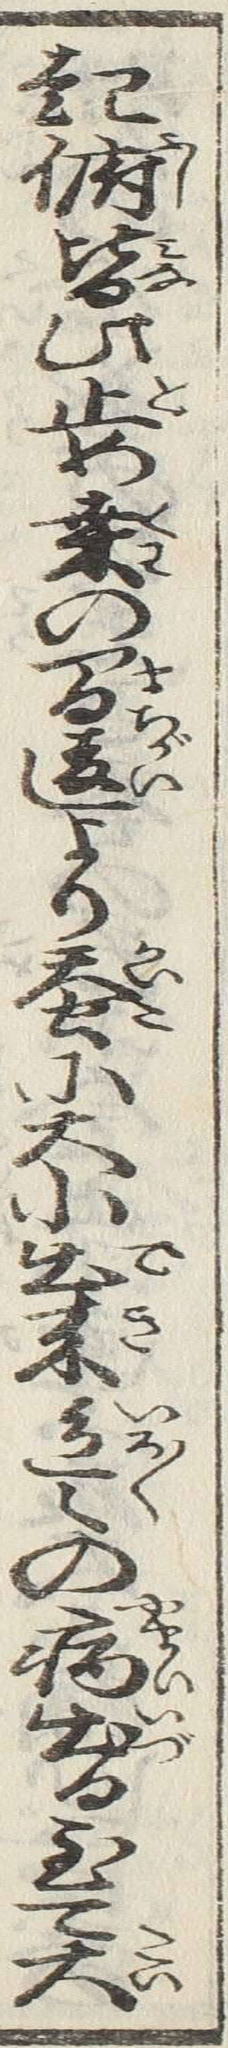起俯皆此止め桑の間違より蚕に大小出来色々の病出る至て大
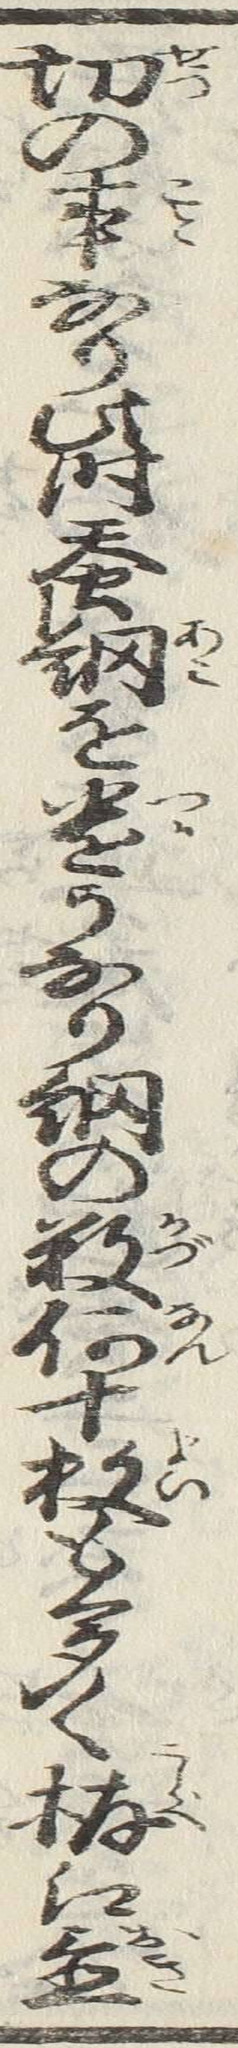切の事なり此時蚕し網を遣うなり網の数何十枚も多く拵え置
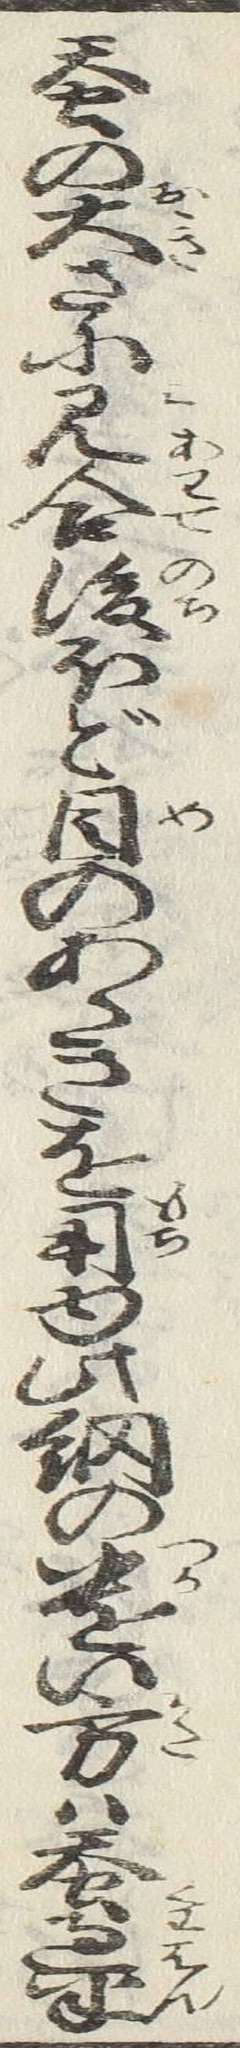蚕の大さに見合後ほど目のあらきを用ゆ此網の遣い方は蚕過半
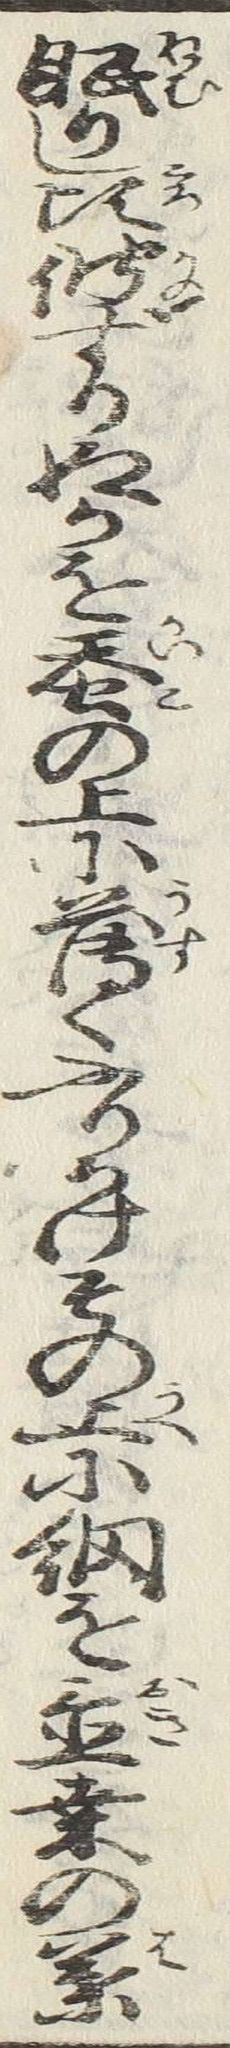眠りし頃彼すりぬかを蚕の上に薄くふりかけその上に網を置桑の葉
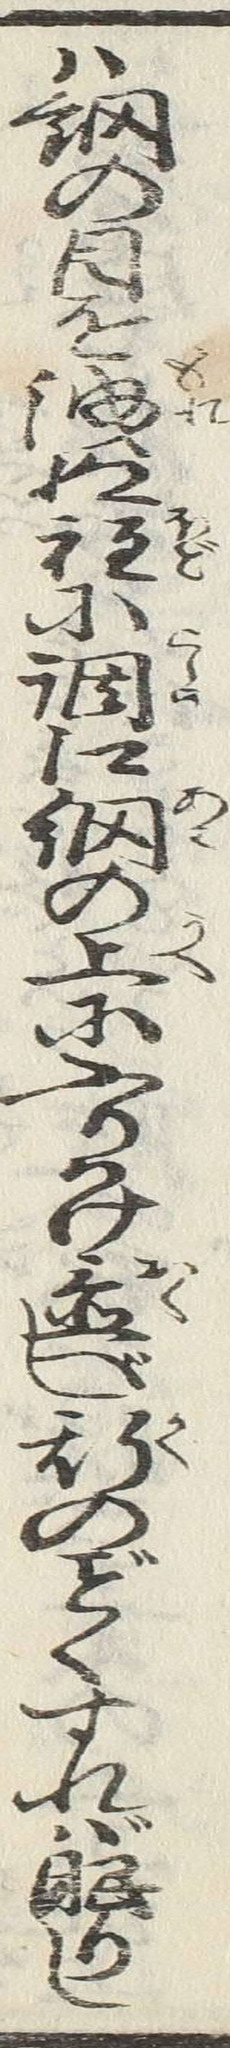は網の目を洩ぬ程に調え網の上にふりかけ置べし斯のごとくすれば眠りし
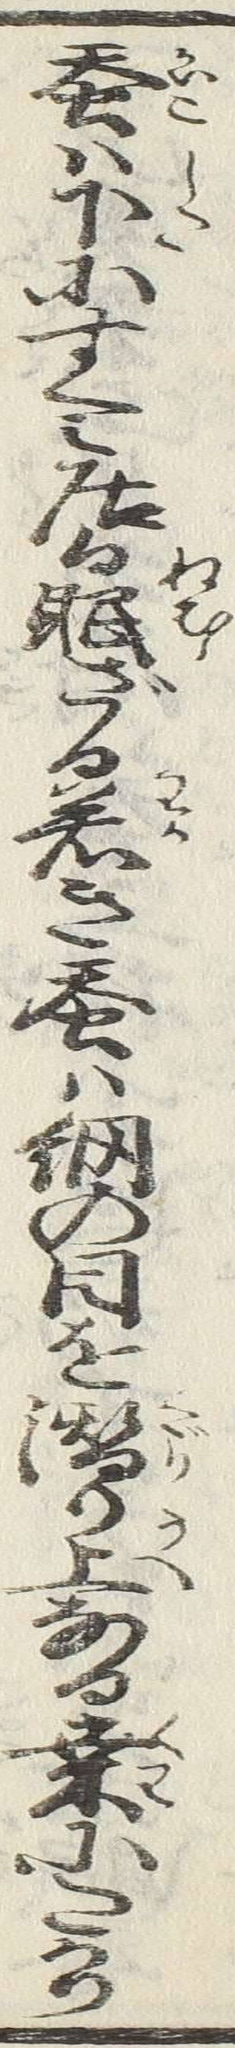蚕は下にすくみ居る眠ざる若き蚕は網の目を潜り上なる桑にたかり
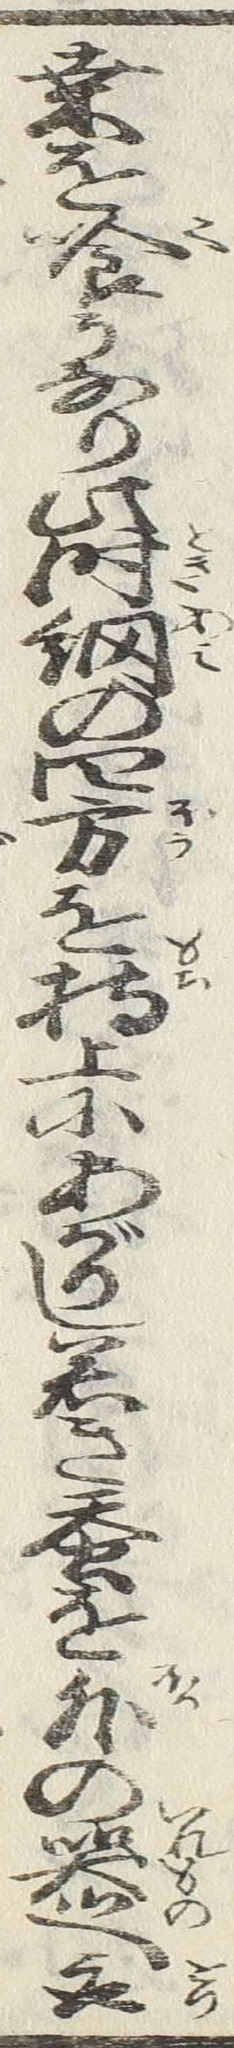桑を喰うなり此時網の四方を持上にあがりし若き蚕を外の器へ取
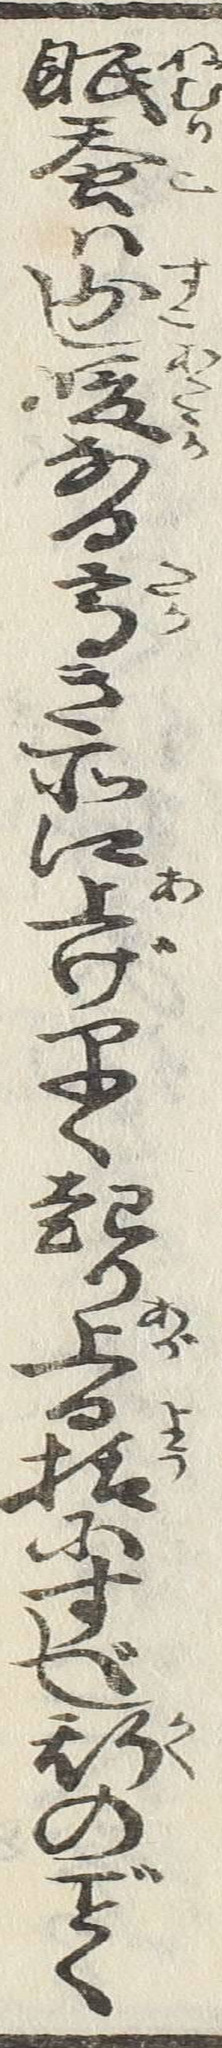眠蚕は少し暖なる高き所え上げ早く起り上る様にすべし斯のごとく
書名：養蠶實驗録
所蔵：東京大学農学生命科学図書館 国文学研究資料館
